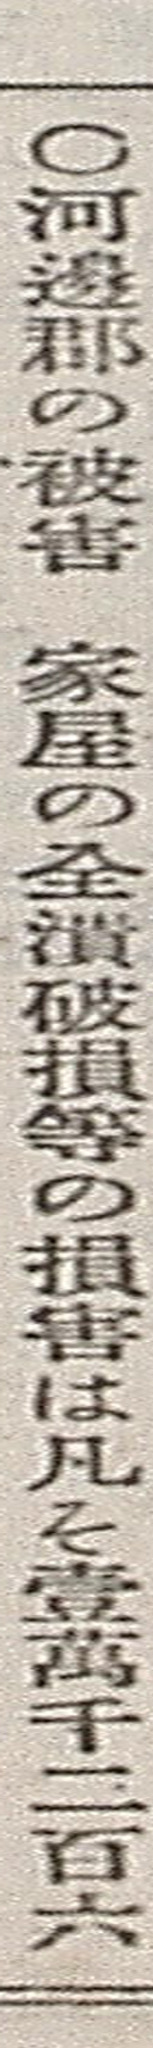〇河辺郡の被害家屋の全潰破損等の損害は凡そ壱万千二百六
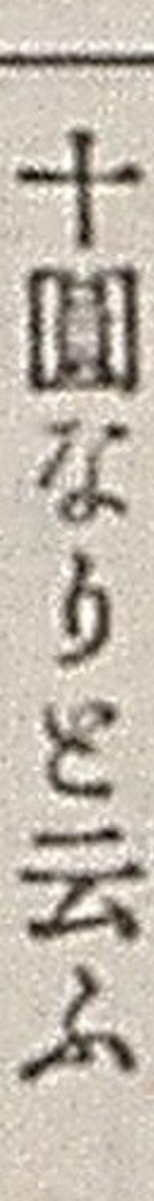十円なりと云ふ
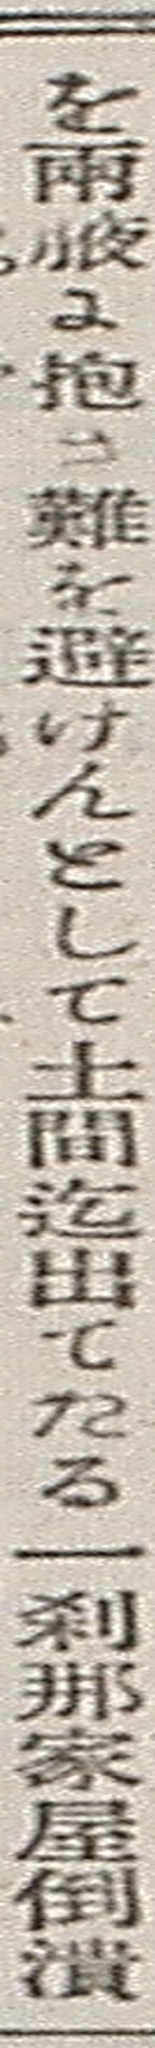を両腋に抱き難を避けんとして土間迄出てたる一刹那家屋倒潰
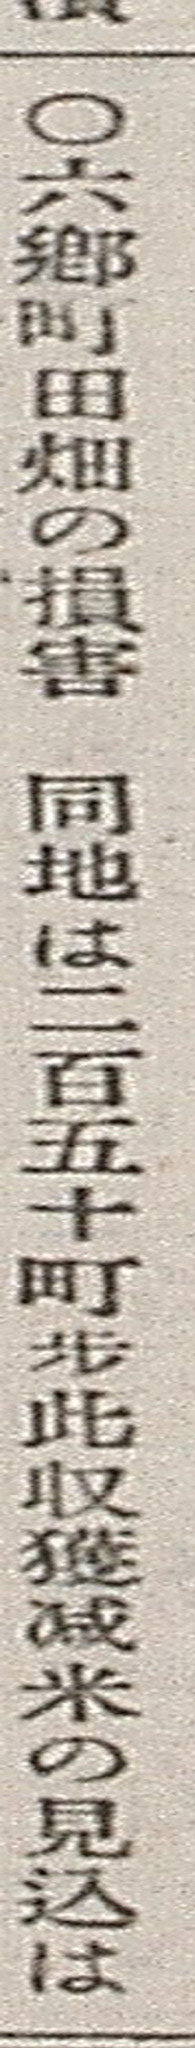〇六郷町田畑の損害同地は二百五十町歩此収穫減米の見込は
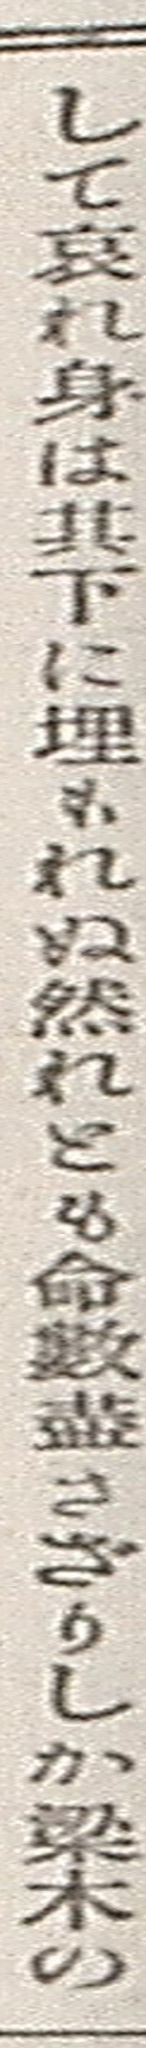して哀れ身は其下に埋もれぬ然れとも命数尽きざりしか梁木の
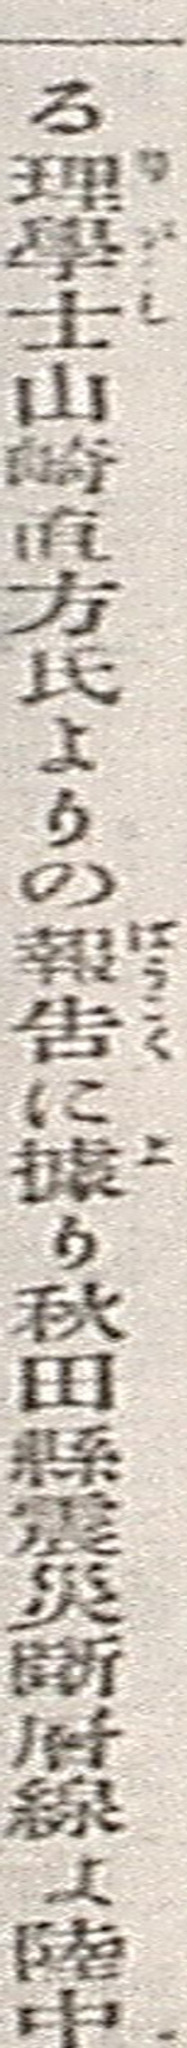る理学士山崎直方氏よりの報告に拠り秋田県震災断層線に陸中
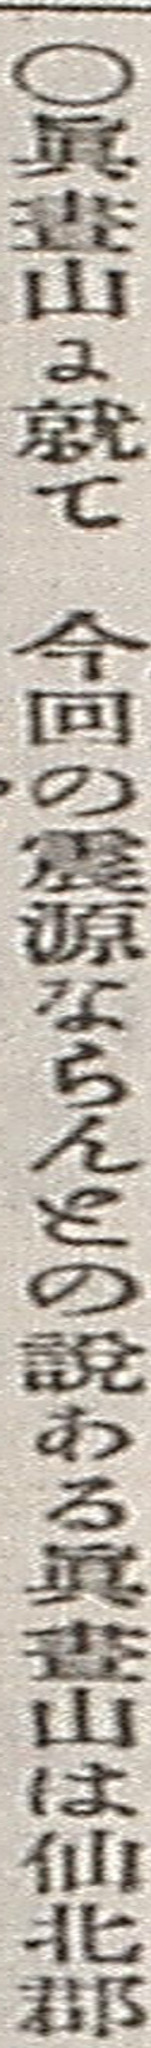〇真昼山に就て今回の震源ならんとの説ある真昼山は仙北郡
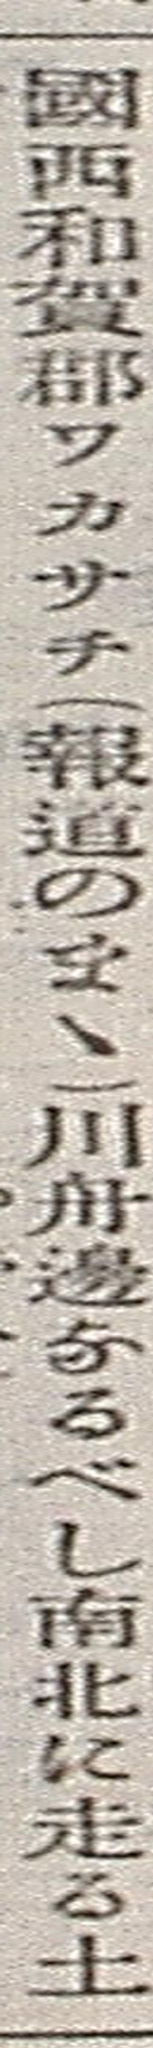国西和賀郡ワカサチ川舟辺なるべし南北に走る土
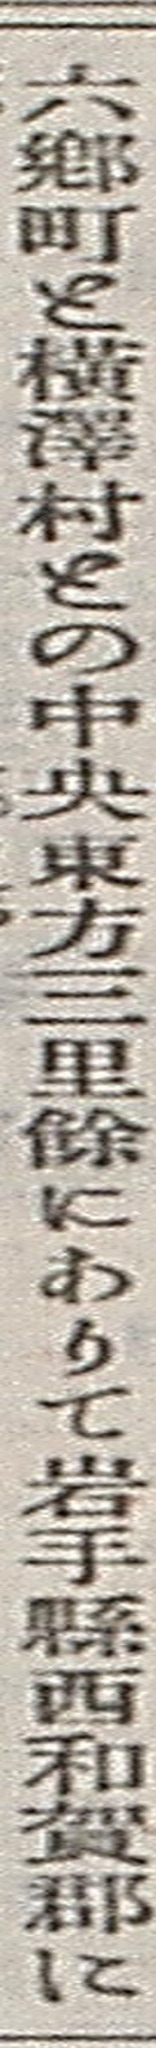徳郷町と横沢村との中央東方三里余にありて岩手県西和賀郡に
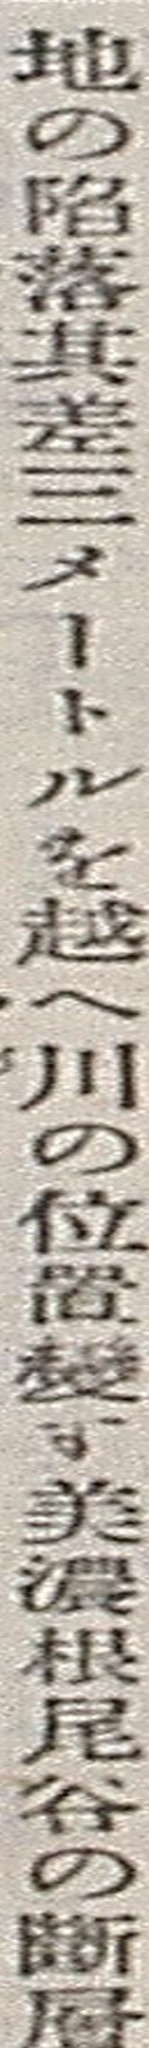地の陥落其差三メートルを越へ川の位置変す美濃根尾谷の断層
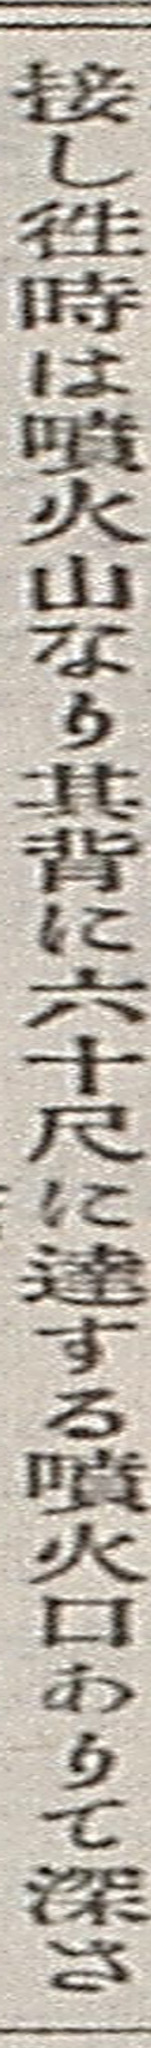接し往時は噴火山なり其背に六十尺に達する噴火口ありて深さ
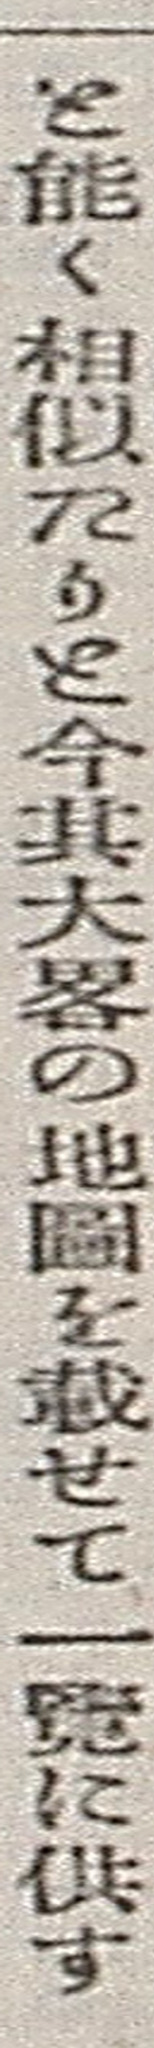と能く相似たりと今其大略の地図を載せて一覧に供す
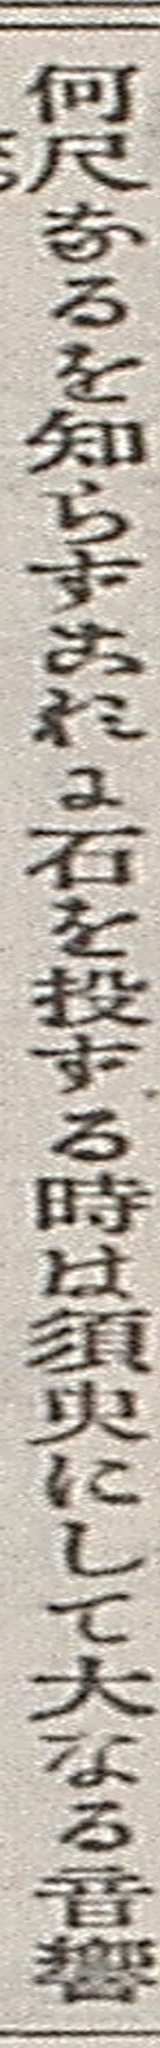何尺なるを知らずこれに石を投ずる時は須臾にして大なる音響
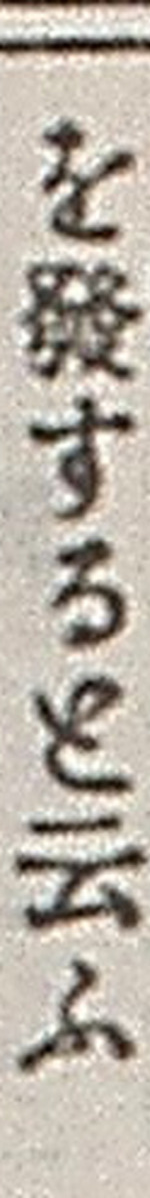を発すると云ふ
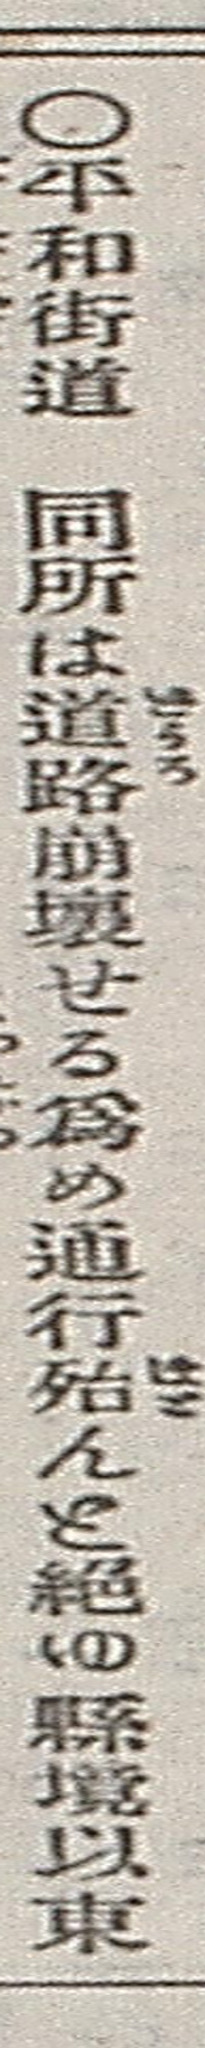〇平和街道同所は道路崩壊せる為め通行殆んと絶ゆ県境以東
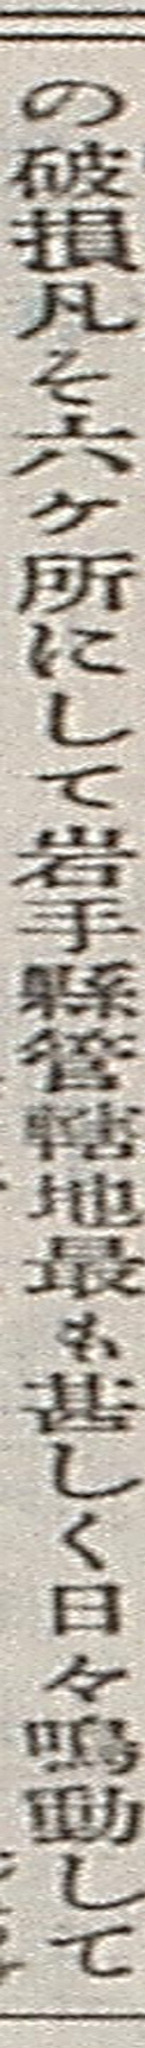の破損凡そ六ケ所にして岩手県管轄地最も甚しく日々鳴動して
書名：風俗畫報臨時増刊第百二十四號　洪水地震被害録（上）
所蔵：東京大学地震研究所図書室 Earthquake Research Institute Library, The University of Tokyo, JAPAN
